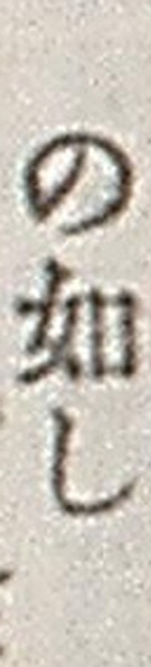の如し
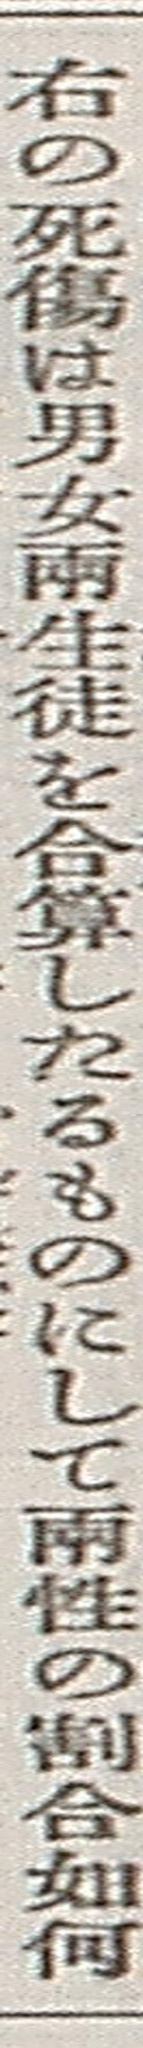右の死傷は男女両生徒を合算したるものにして両性の割合如何
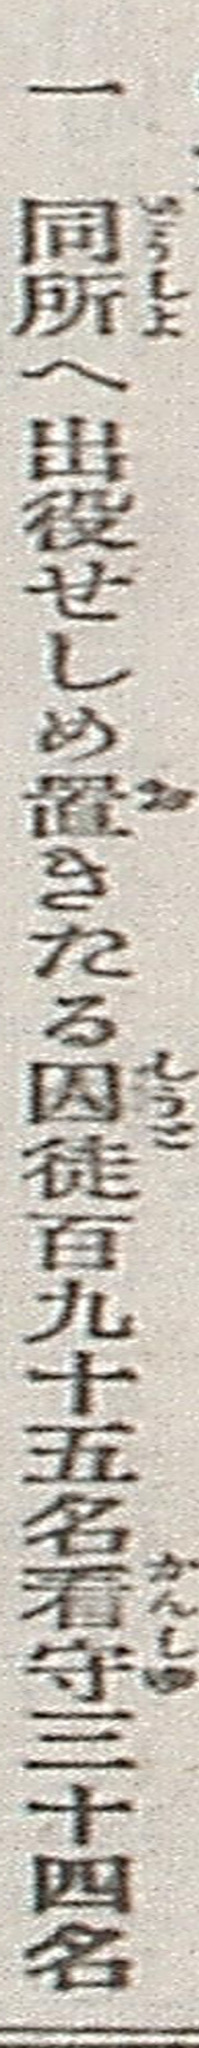一同所へ出役せしめ置きたる囚徒百九十五名看守三十四名
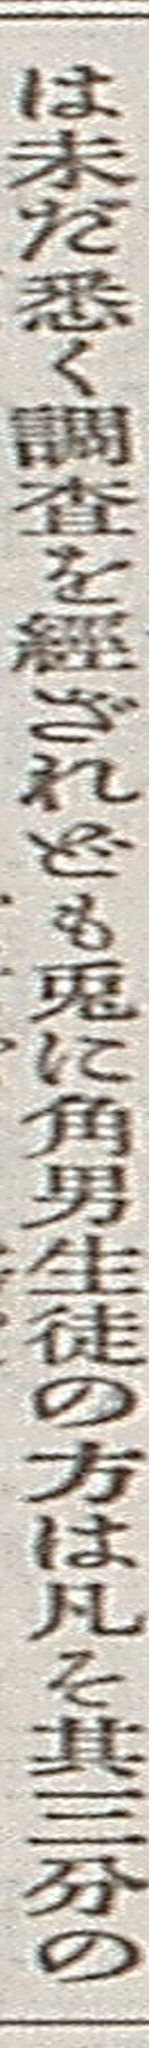は未だ悉く調査を経ざれども兎に角男生徒の方は凡そ其三分の
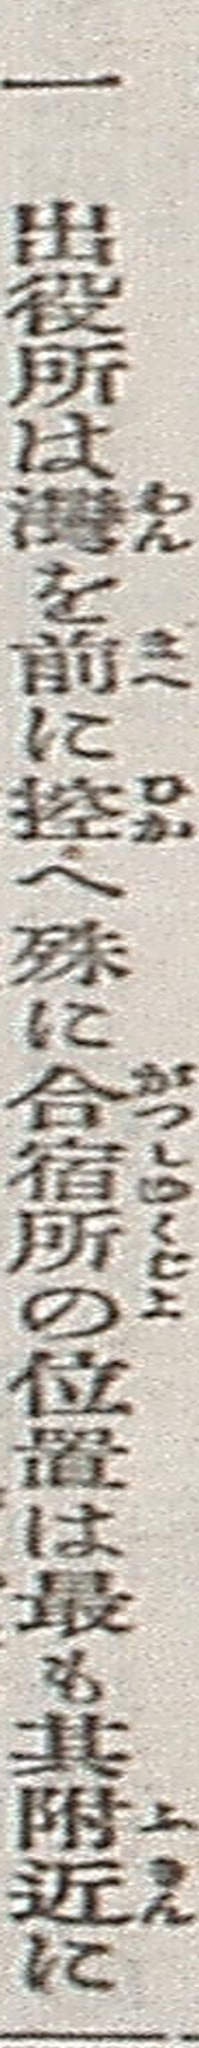一出役所は湾を前に控へ殊に合宿所の位置は最も其付近に
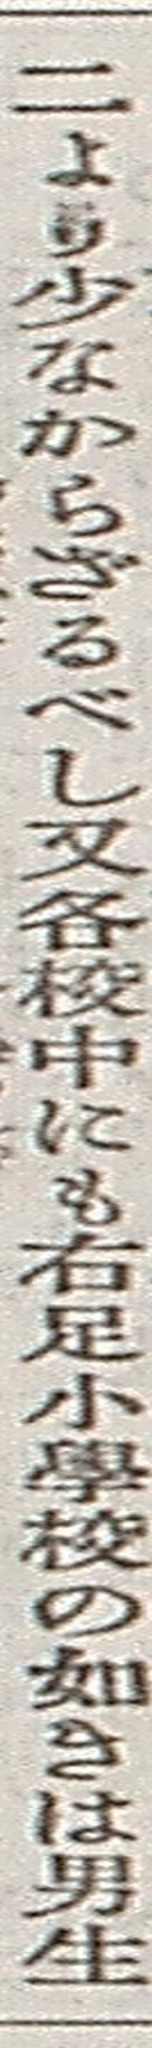二より少なからざるべし又各校中にも右足小学校の如きは男生
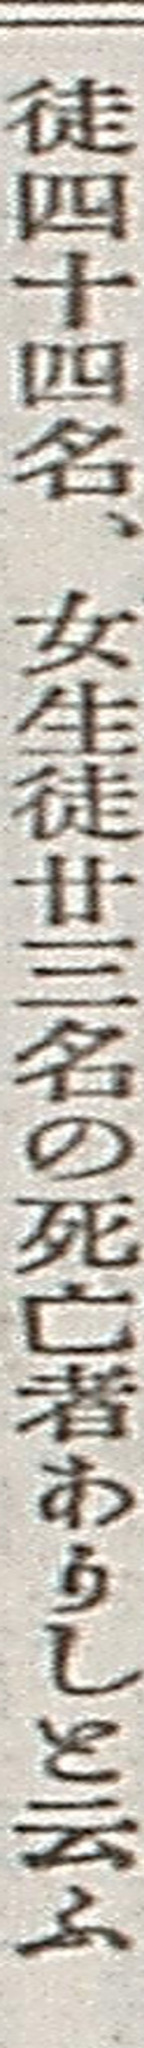徒四十四名、女生徒廿三名の死亡者ありしと云ふ
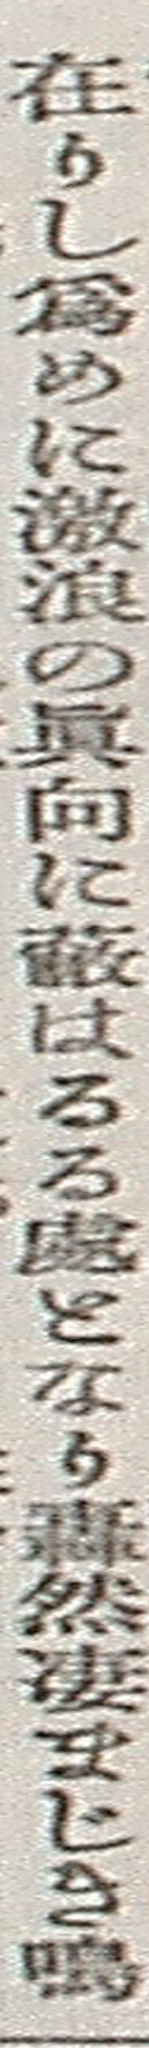在りし為めに激浪の真向に蔽はるる処となり轟然凄まじき鳴
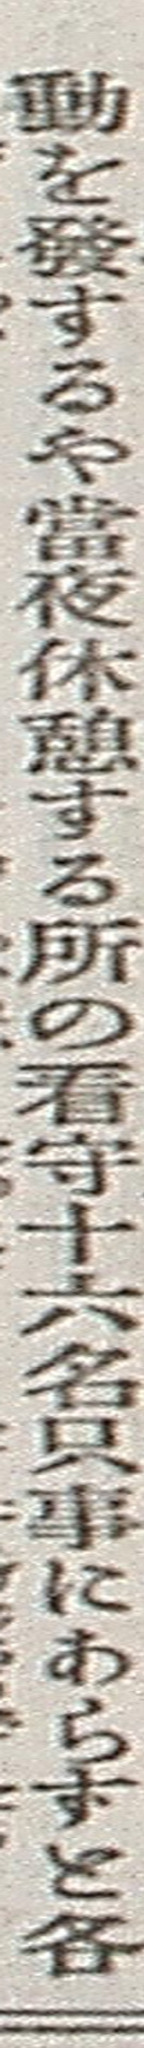動を発するや当夜休憩する所の看守十六名只事にあらずと各
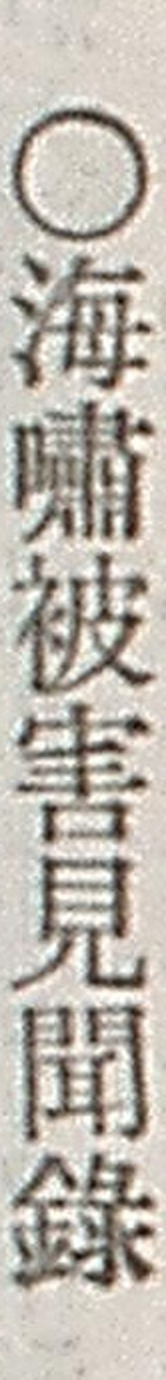○海嘯被害見聞録
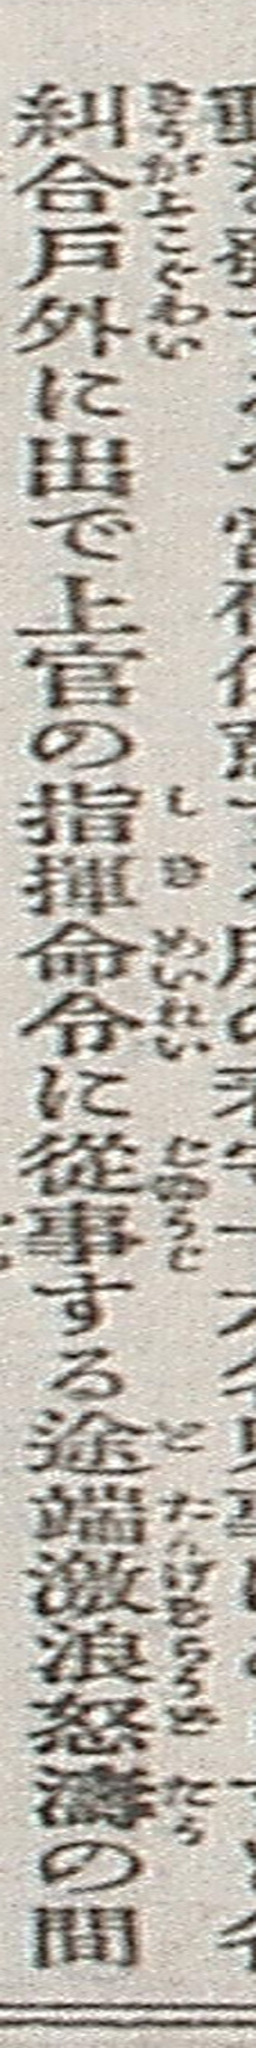糾合戸外に出で上官の指揮命令に従事する途端激浪怒濤の間
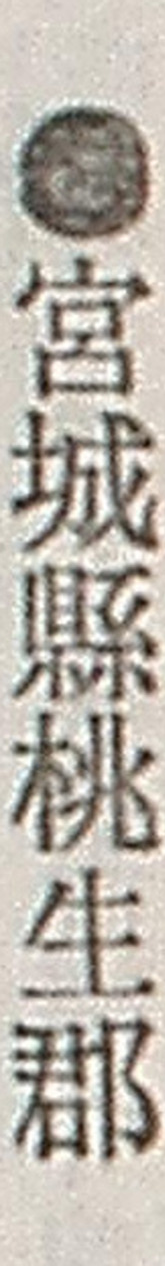●宮城県桃生郡
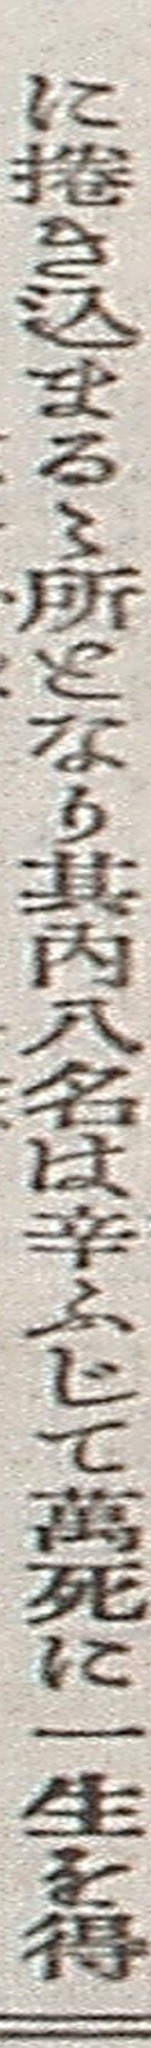に捲き込まるゝ所となり其内八名は辛ふじて万死に一生を得
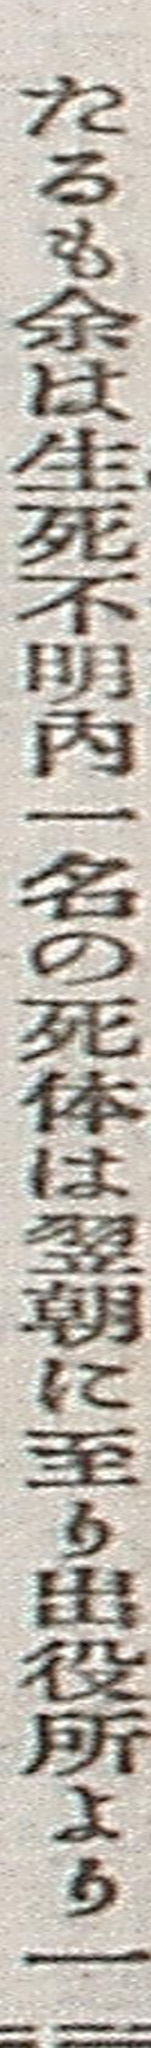たるも余は生死不明内一名の死体は翌朝に至り出役所より一

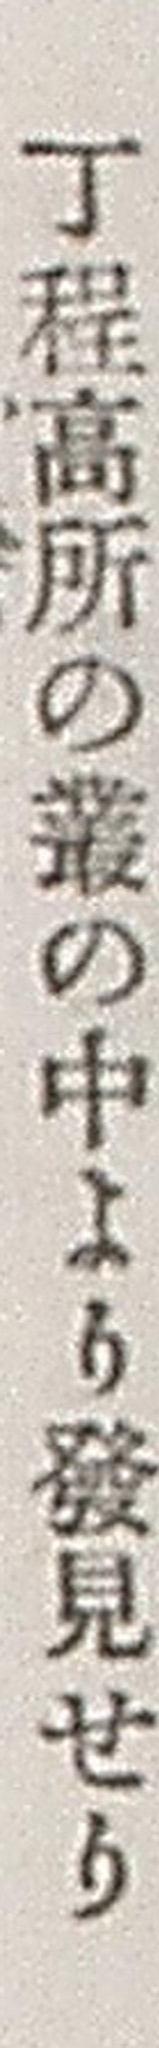丁程高所の叢の中より発見せり
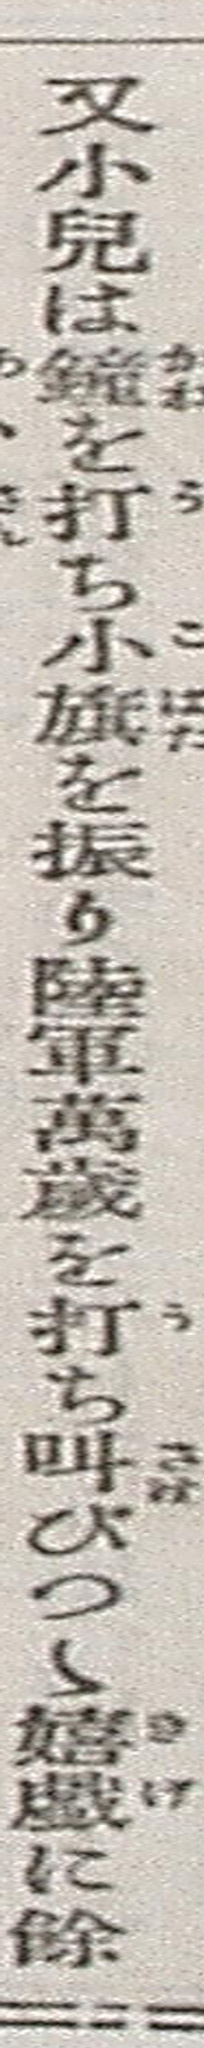又小児は鐘を打ち小旗を振り陸軍万歳を打ち叫びつゝ嬉戯に余
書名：風俗畫報臨時増刊第百十九號　大海嘯被害録（中）
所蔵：東京大学地震研究所図書室 Earthquake Research Institute Library, The University of Tokyo, JAPAN
